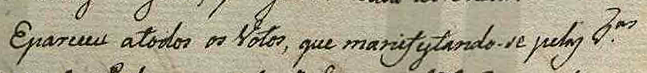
E pareceu a todos os Votos, que manifestando-se pelas T.as
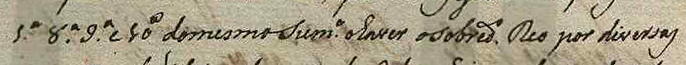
1.a 8.a 9.a e 10a do mesmo sum.o o haver o sobred.o Reo por diversas
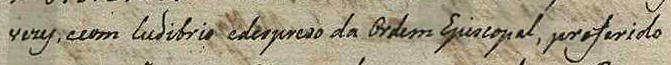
vezes, e com ludibrio e despreso da Ordem Episcopal, proferido
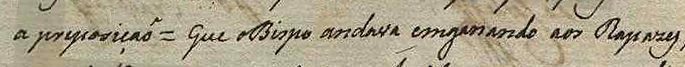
a preposiçaõ = Que o Bispo andava emganando aos Rapazes,
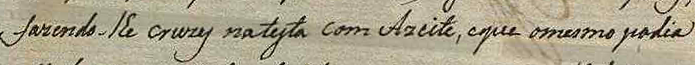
fazendo-lhe cruzes na testa com Azeite, e que o mesmo podia
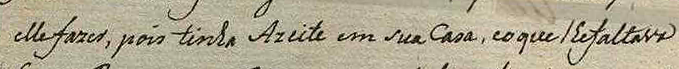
elle fazer, pois tinha Azeite em sua casa, e o que lhe faltava
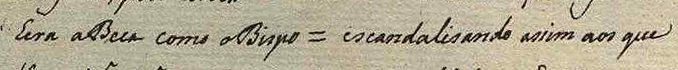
hera a Beca como o Bispo = escandalisando assim aos que
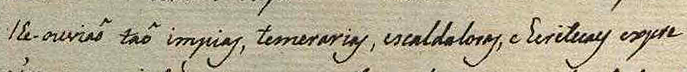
lhe ouviaõ taõ impias, temerarias, escaldalosas, e heritecaes expre
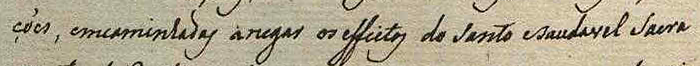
ções, emcaminhadas a negar os effeitos do santo e saudavel Sacra
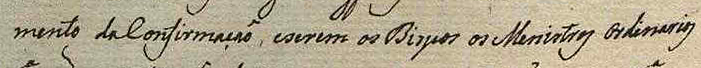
mento da Confirmaçaõ, e serem os Bispos os Menistros Ordinarios
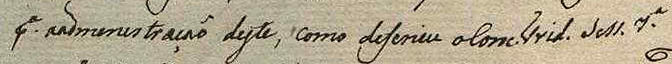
p.a a admenestraçaõ deste, como defeniu o Conc. Trid. sess. 7.a
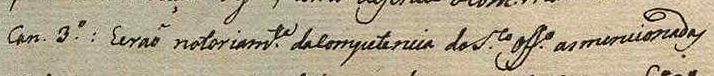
Con. 3.o: heraõ notoriam.te da competencia do S.to off.o as mencionadas
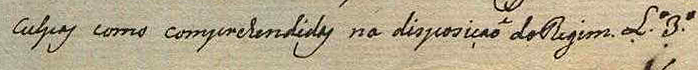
culpas como comprehendidas na disposiçaõ do Regim. L.o 3.o
